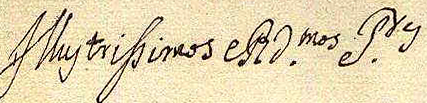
Jllustrissimos e Rd.mos S.res
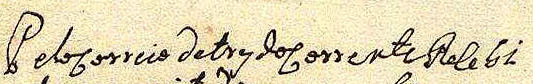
Pelo Correio de tres do Corrente ReCebi
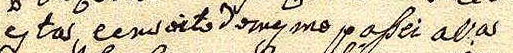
esta, e em oito do mesmo passei a V.a
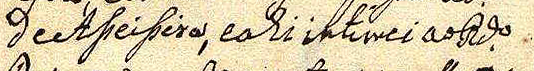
de Asseisseira, e ahi intimei ao R.do
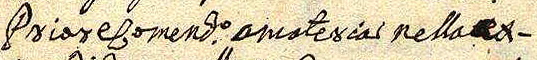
Prior e Comend.o a materia nella ex
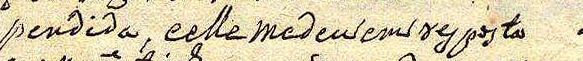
pendida, e elle me deu em resposta
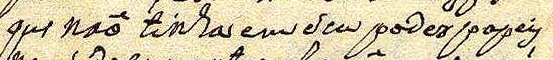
que naõ tinha em seu poder papeis
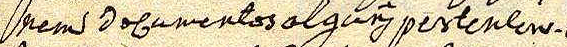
nem documentos algun̄s pertencen
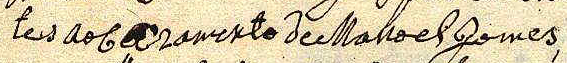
tes ao Cazamento de Manoel Gomes
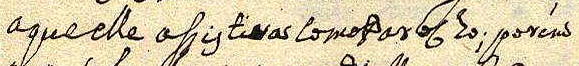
a que elle assistira como Parocho; porem
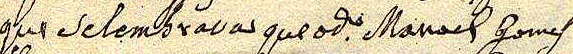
que se lembrava que o d.o Manoel Gomes
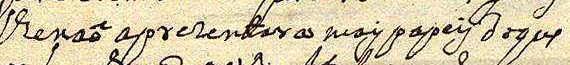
lhe naõ aprezentara mais papeis do que
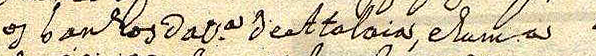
os banhos da V.a de Atalaia, e huma
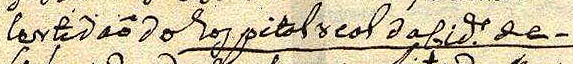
certidaõ do hospital real da Cid.e de
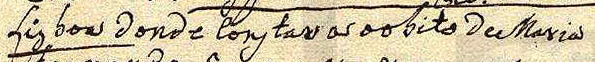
Lisboa donde constava o obito de Maria
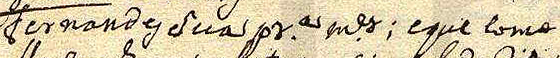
Fernandes sua pr.a m.er; e que como
